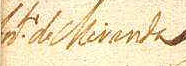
_nt.o de Miranda
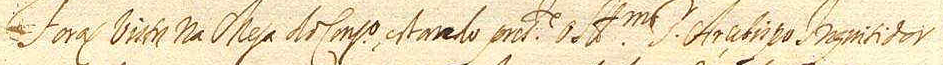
Foraõ vistos na Mesa do Cons.o estando pres.te o Ill̄.mo S.r Arçebispo Inquisidor
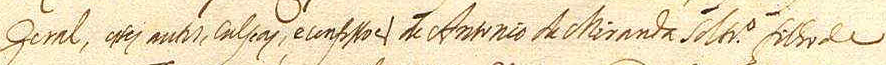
Geral, estes autos, culpas, e confissoes̄ de Antonio de Miranda soltr.o filho de
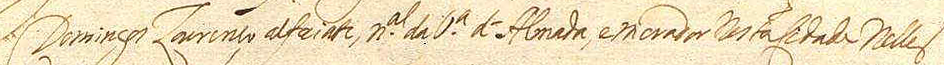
Domingos Lourenço alfaiate, n.al da V.a de Almada, e morador nesta Cidade nelles
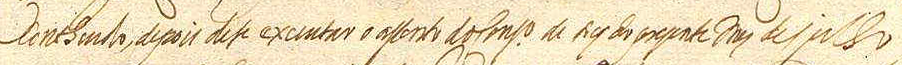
contheudo, depois de se executar o assento do Cons.o de tres do presente mes de julho,
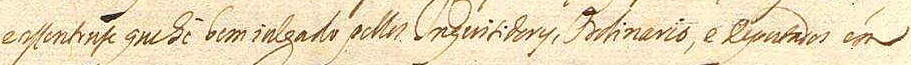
e assentouse que hé bem iulgado pellos Inquisidores, Ordinario, e deputados em
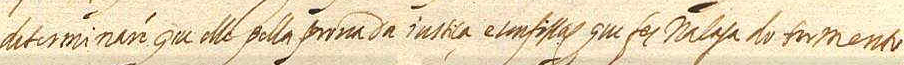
determinarē que elle pella proua da iustiça e confissaõ que fes na casa do tormento
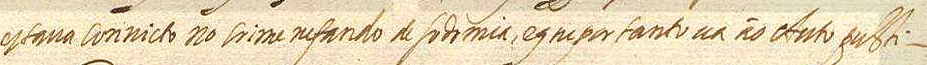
estaua conuicto no crime nefando de sodomia, e que portanto ua áo Auto publi
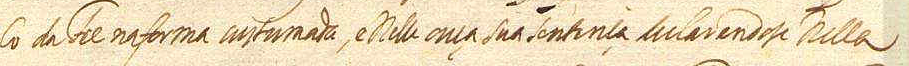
Co da Fee na forma custumada, e nelle ouça sua sentença declarandose nella
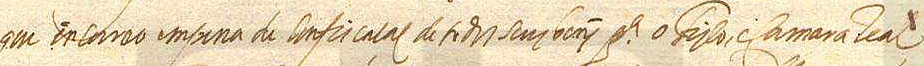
que incorreo em pena de confiscaçaõ de todos seus bens̄ p.a o Fisco, e Camara Real
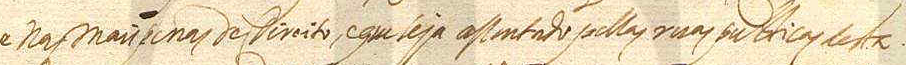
e nas mais penas de Direito, e que seja assoutado pellas ruas publicas desta
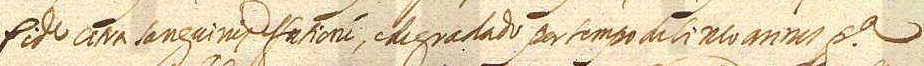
Cide citra sanguinis effusionē, e degradado por tempo de cinco annos p.a
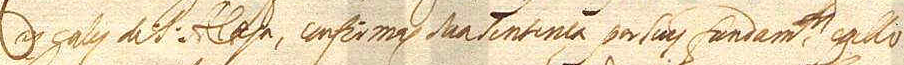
as gales de S. Altesa, confirmaõ sua sentença por seus fundamtos, e pello
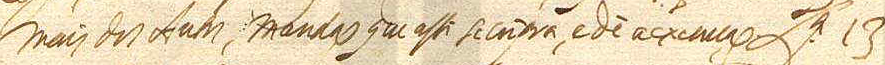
mais dos Autos, mandaõ que assi se cūpra, e dē a execuçaõ Lx.a 13
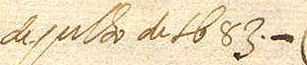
de julho de 1683. ‒
